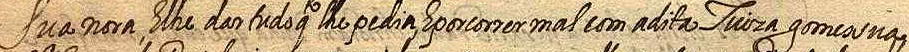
Sua nora, E lhe dar tudo qto lhe pedia, E por correr mal com a dita Luiza gomes sua
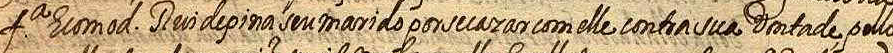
f.a E com o d. Rui de pina seu marido por se cazar com elle contra sua Vontade, pello
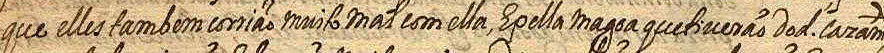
que elles tambem corrião muito mal com ella, E pella magoa que tiuerão do d. cazam.to
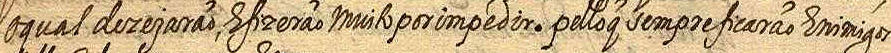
o qual dezajarão, E fizerão muito por impedir, pelo q̄ sempre ficarão Enimigos
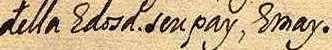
della E dos d. seu pay, E may.
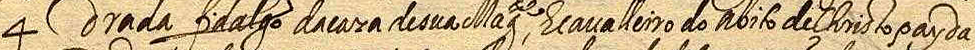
4 drada fidalgo da caza de sua Magde, E caualleiro do abito de Christo pay da
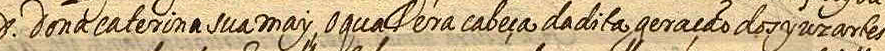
d. dona caterina sua may, o qual era cabeça da dita geração dos yuzartes
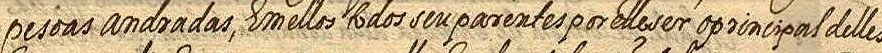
pesoas andradas, E mellos todos seu parentes por elle ser o principal delles
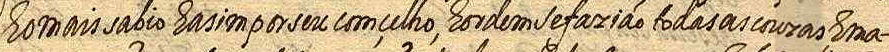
E o mais sabio E asim por seu comcelho, E ordem se fazião todas as couzas E ma
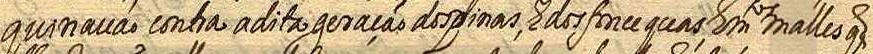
quinauão contra a dita geração dos pinas, E dos foncequas, E mtos malles q̄
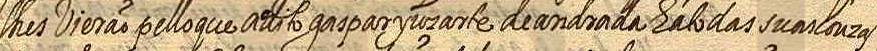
lhes Vierão pello que a dito gaspar yuzarte de andrada E a todas sua couzas
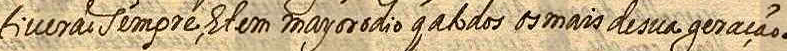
tiuerão sempre, E tem mayor odio q̄ a todos os mais de sua geração.
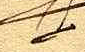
Pa
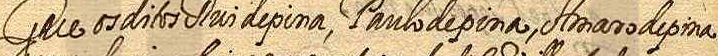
Que os ditos Rui de pina, Paulo de pina, Amaro de pina
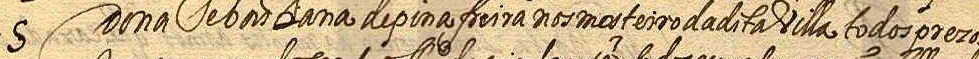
5 dona Sebastiana de pina freira nos mosteiro da dita Villa todos prezos
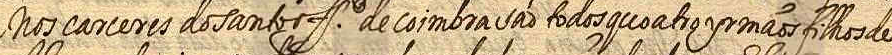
nos carceres do santo off.o de coimbra são todos quoatro yrmãos filhos de
